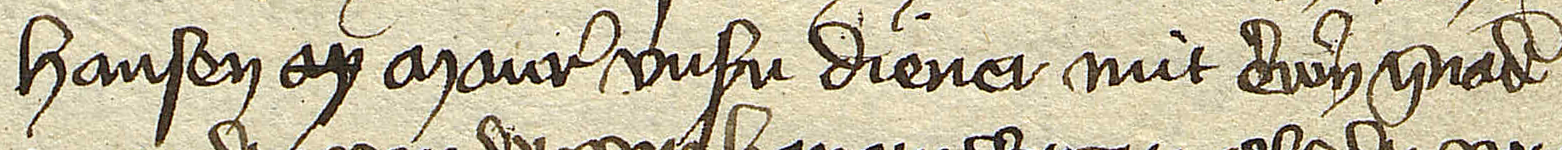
hanſen M Maur* vnſ*n diener mit ewn* gnad*
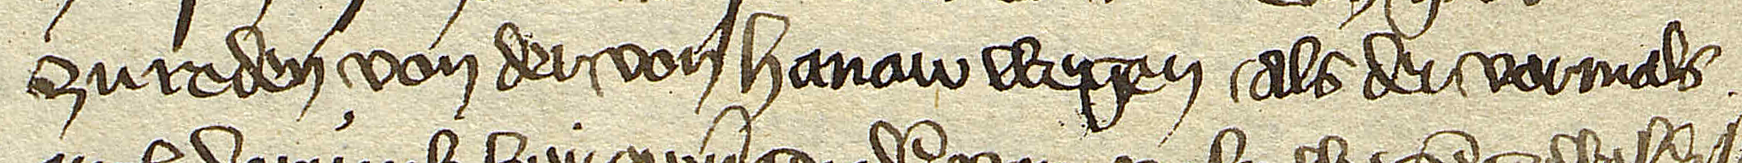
cʒu reden von der von hanaw wegen / Als der vormals
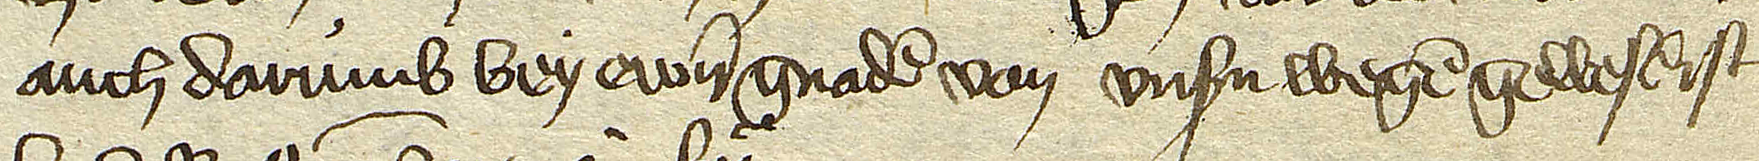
auch darümb bey ewn* gnad* von vnſ*n wege* geweſe* iſt
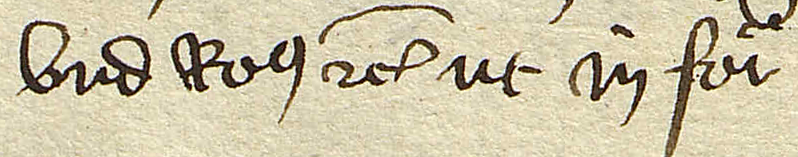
vnd Ro* ec* ut in for*
